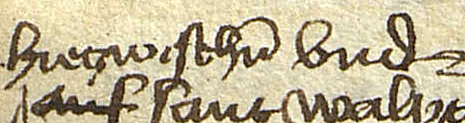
hiecʒwiſchn* vnd
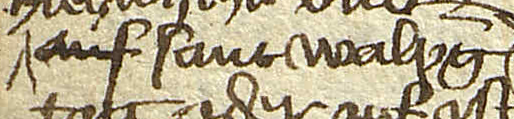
auf ſant Walp*g*
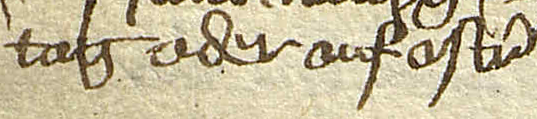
tag oder auf oſtn*
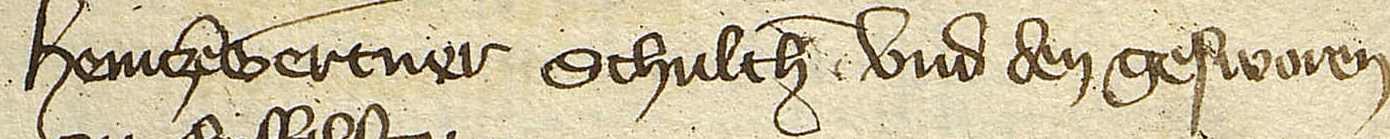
heincʒe* Gertner Schulth* vnd den geſworen
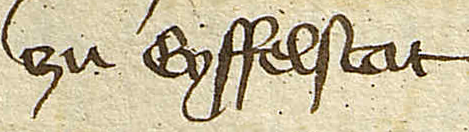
cʒu Eyffelſtat
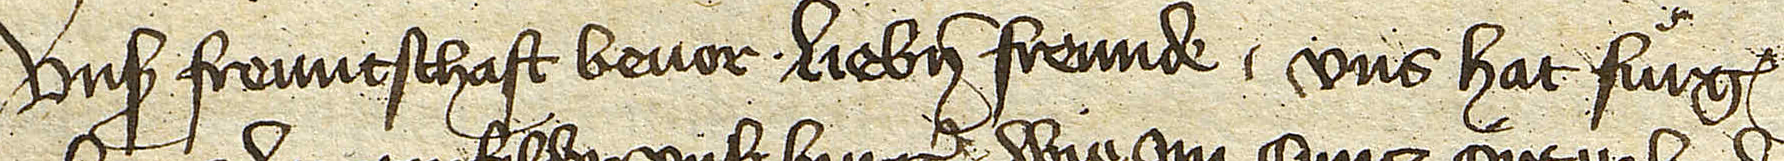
Vnſ* freuntſchaft beuor . liebn* freunde / vns hat fürg*
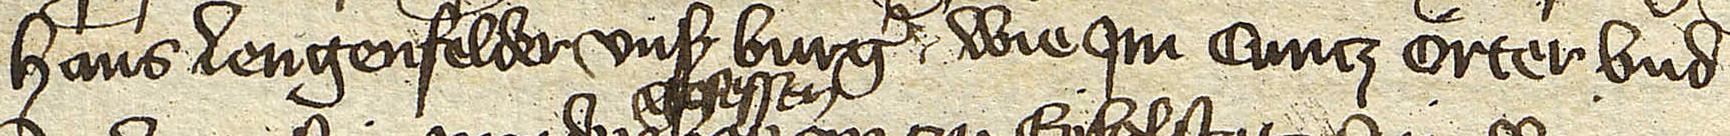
hans lengenfelder vnſ* burg* / wie Im Cuncʒ Örter vnd
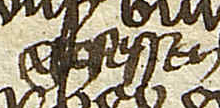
geſeſſen
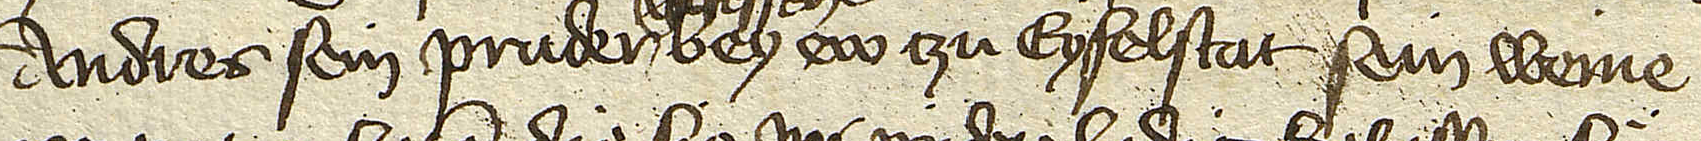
Andres ſein pruder bey ew cʒu Eyfelſtat ſein weine
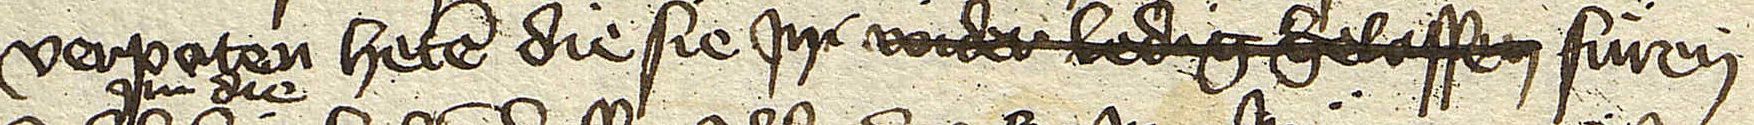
verpoten hete* die ſie In wider ledig gelaſſen füren
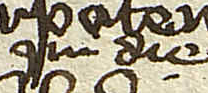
Im die
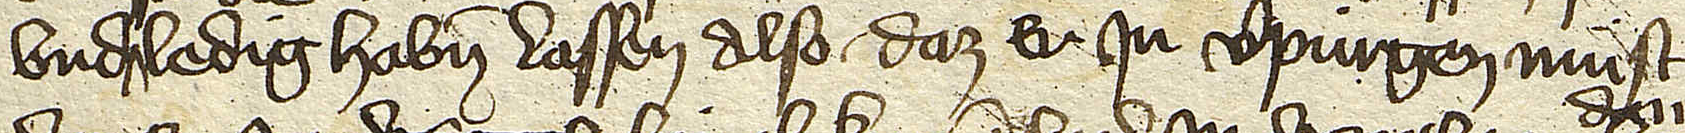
vnd ledig habn* laſſen Alſo / daʒ Er In v*pürgen müſt
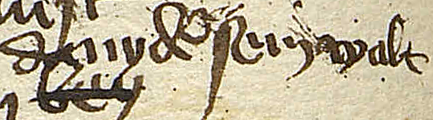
danyde* ſein wolt
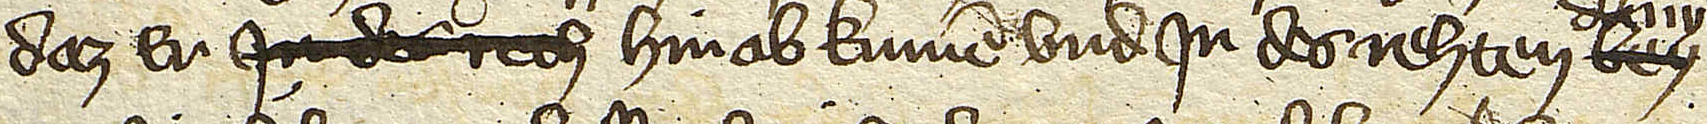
daʒ Er Im des rech hinab kume* vnd In des rehten bey
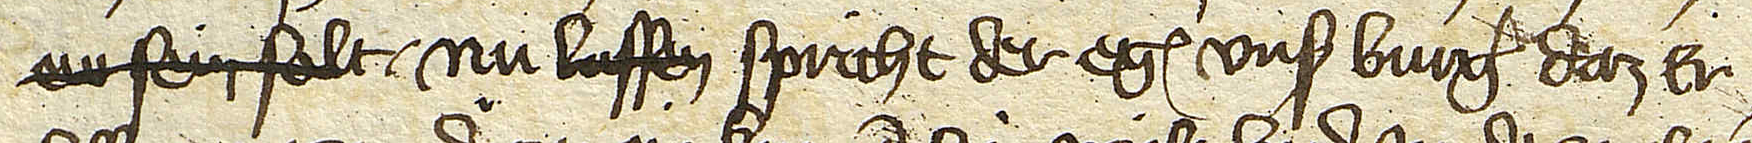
ew ſein ſölt / Nu laſſen ſpricht der eg* vnſ* burg* daʒ Er
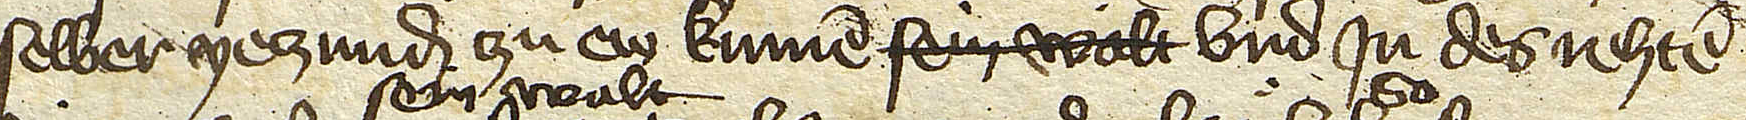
ſelber yecʒund* cʒu ew kume* ſein wölt vnd In des rehte*
